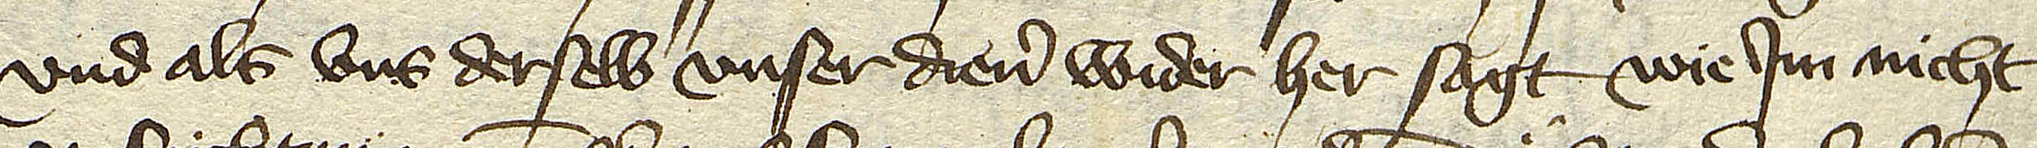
vnd als vns derſelb* vnſer dien* wider her ſagt wie Im nicht
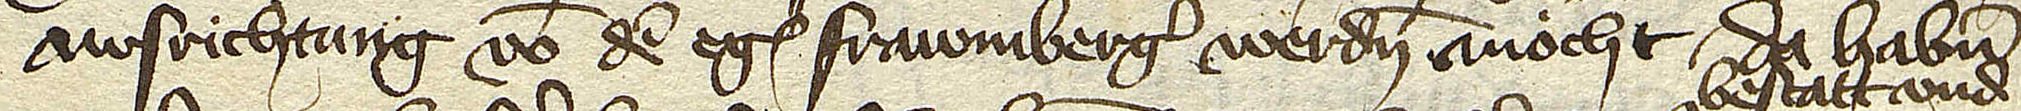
awſrichtung vo* d* eg* frawmberg* werdn* möcht / da habn*
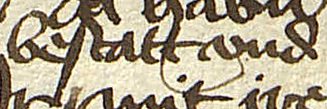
beſtatt vnd
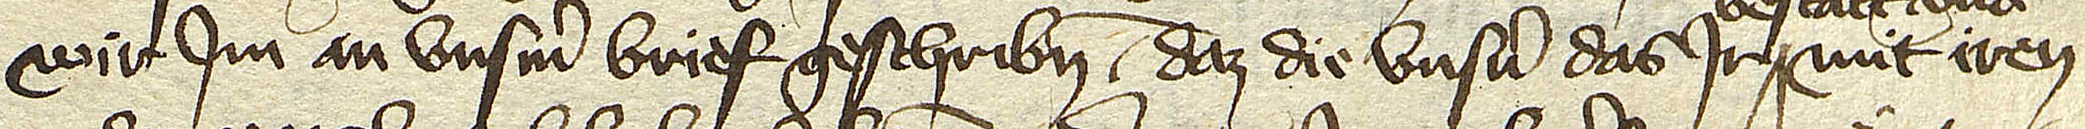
wir Im an vnſm* brief geſchribn* / daʒ die vnſn* das Ir mit iren
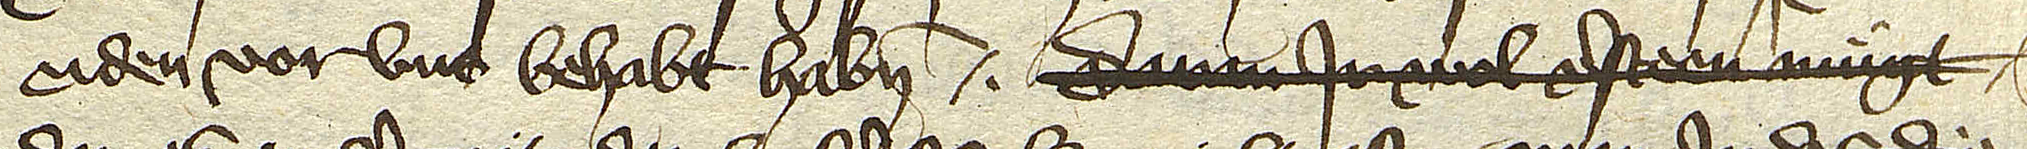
eiden vor vns behabt habn* / . Daran Ir wol v*ſteen mügt /
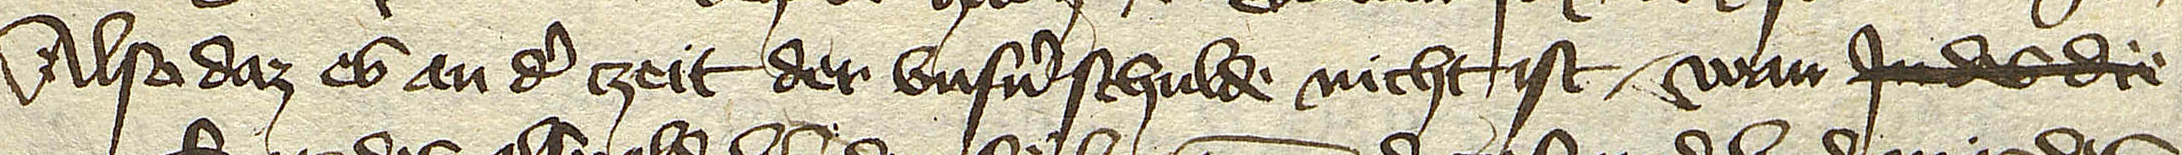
Alſo daʒ es an d* cʒeit der vnſn* ſchulde nicht iſt / wan In des die
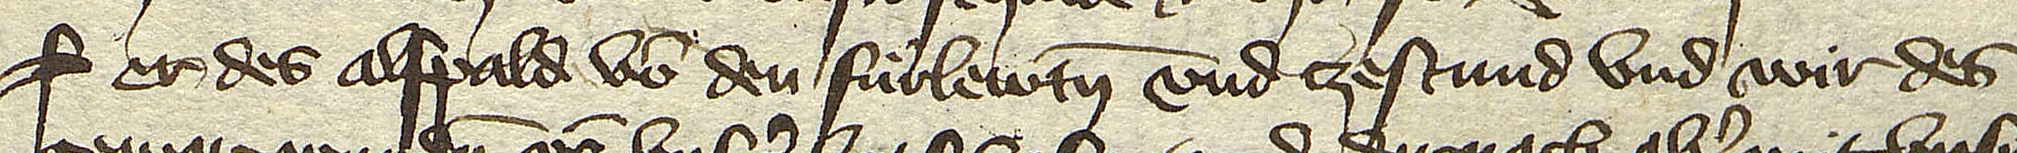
f er des alſpald vo* den fürlewtn* vnd cʒeſtund vnd wir des
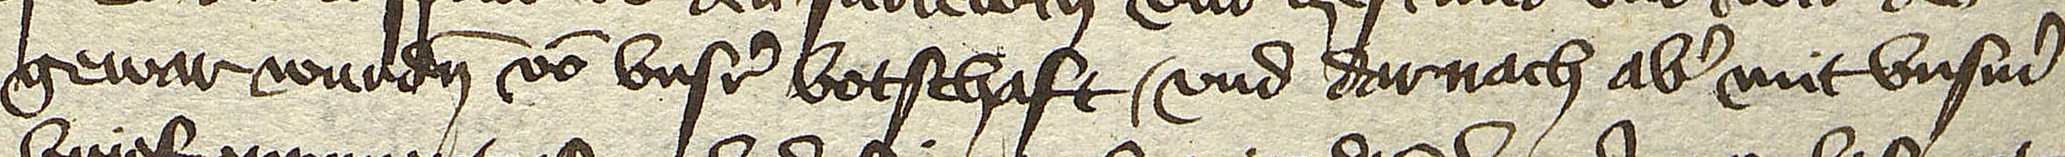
gewar wurdn* vo* vnſr* botſchaft / vnd darnach ab* mit vnſm*
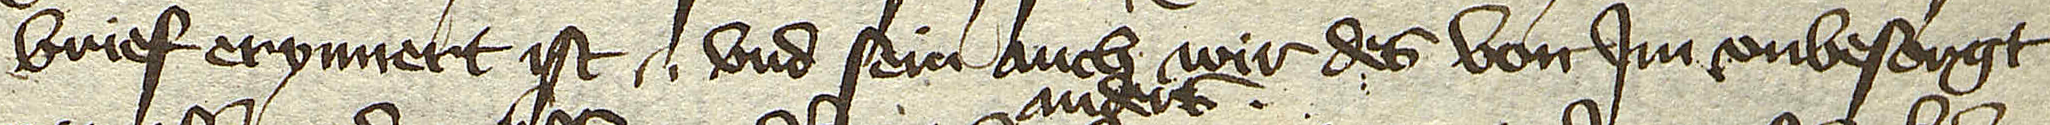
brief erynnert iſt / . vnd ſein auch wir des von Im vnbeſorgt
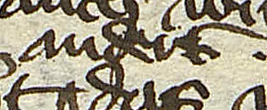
anders
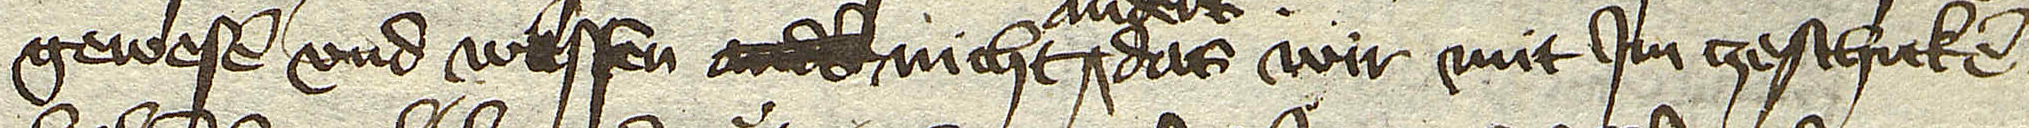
geweſe* vnd wiſſen ands* nicht das wir mit Im cʒeſchicke*
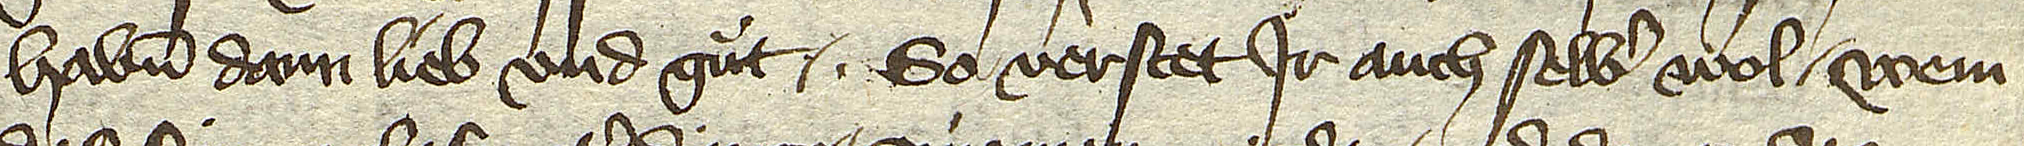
habn* dann lieb vnd güt / . So verſtet Ir auch ſelb* wol / wem
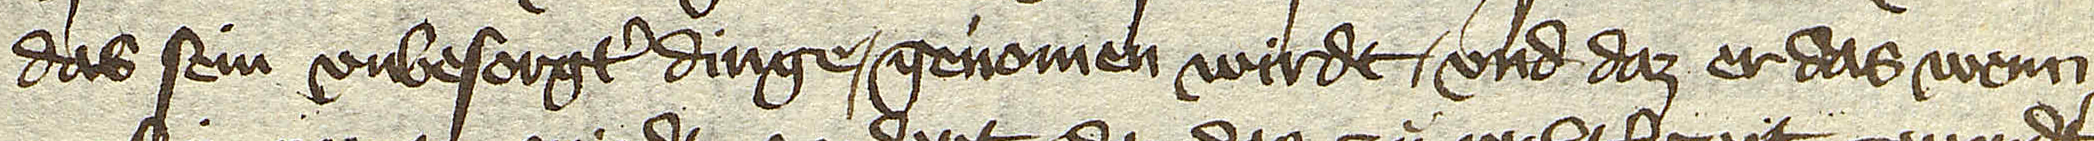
das ſein vnbeſorgt* dinge / genomen wirdt / vnd daʒ er das wenn
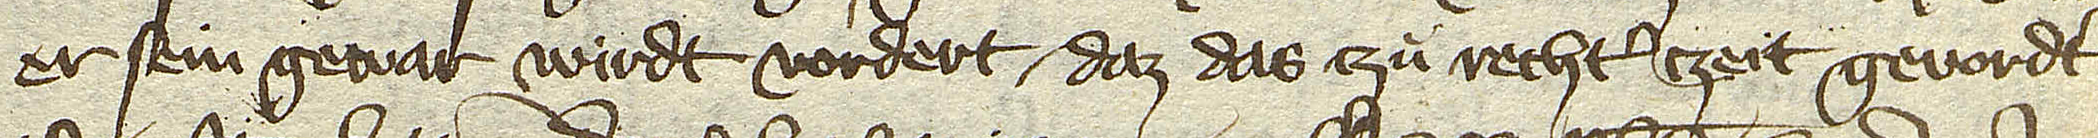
er ſein gewar wirdt vordert / daʒ das cʒü recht* cʒeit gevordt*
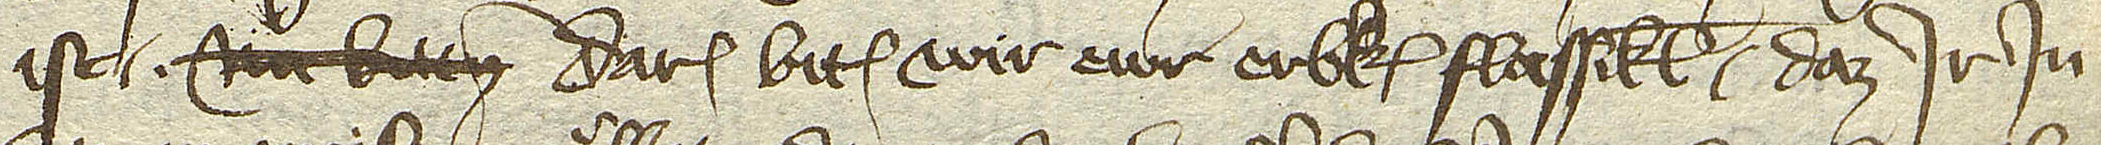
iſt / . Nu bittn* Dar* bit* wir ewr erbk* fleiſſikl* / daʒ Ir In
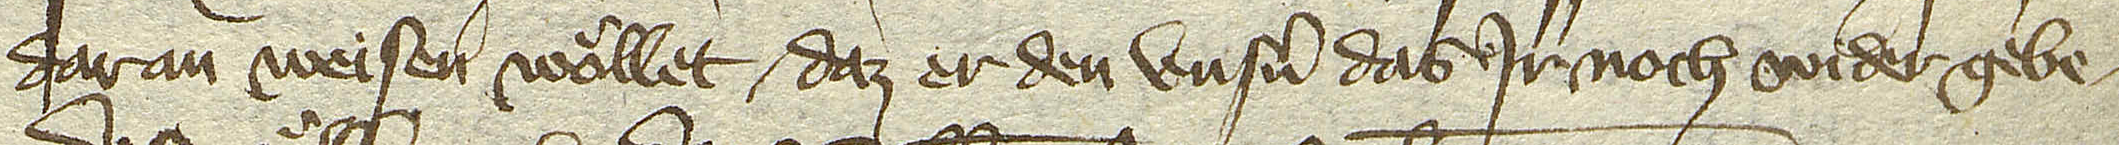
daran weiſen wöllet / daʒ er den vnſn* das Ir noch wider gebe /
